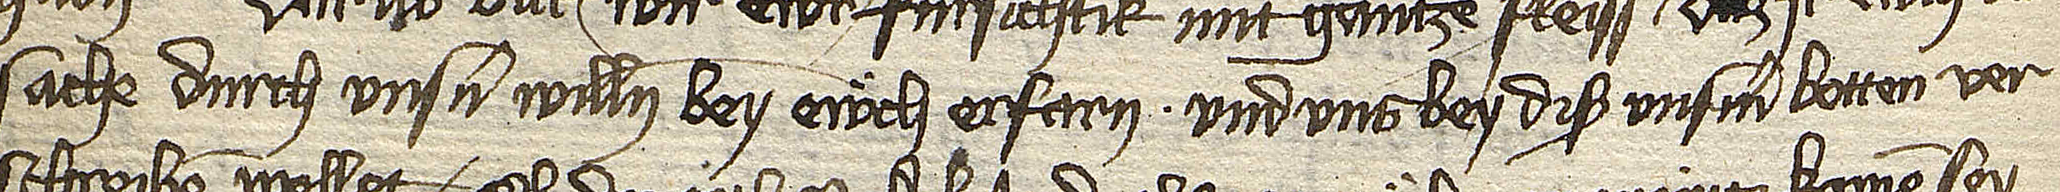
ſache durch vnſn* willn* bey ewch erfarn . vnd vns bey diſ* vnſm* botten ver
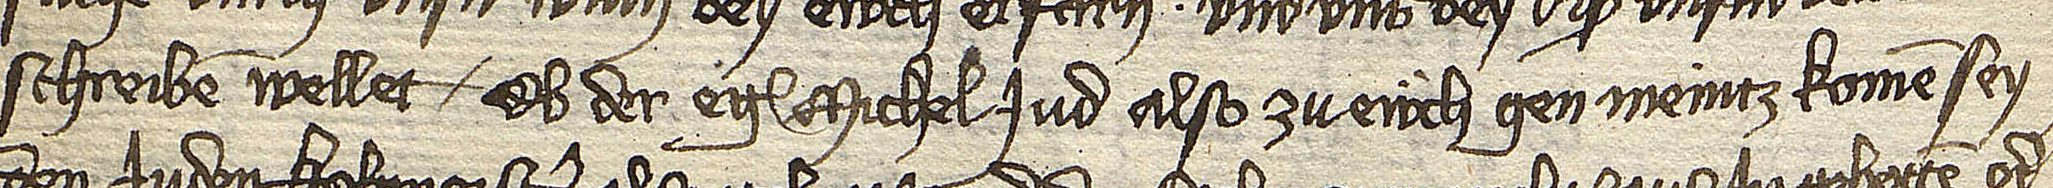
ſchreibe* wellet / Ob der eg* Michel Iud alſo ʒu ewch gen meincʒ kome* ſey
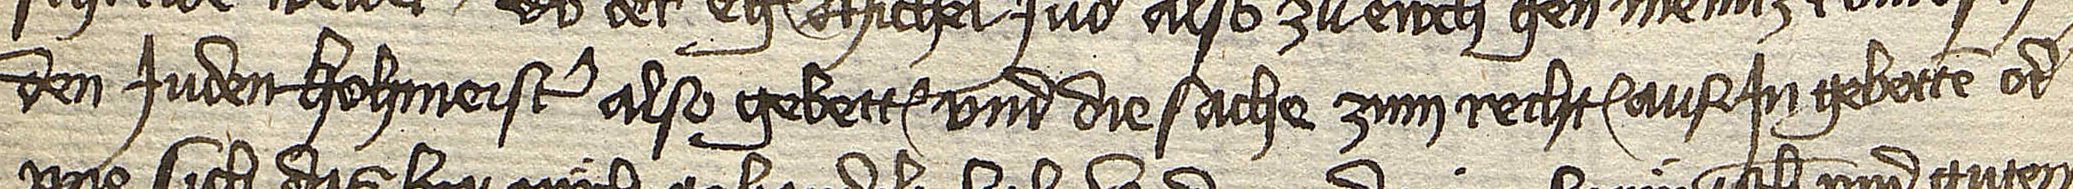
den Iuden Hohmeiſt* alſo gebett* vnd die ſache ʒum recht* auf In gebotte* od*
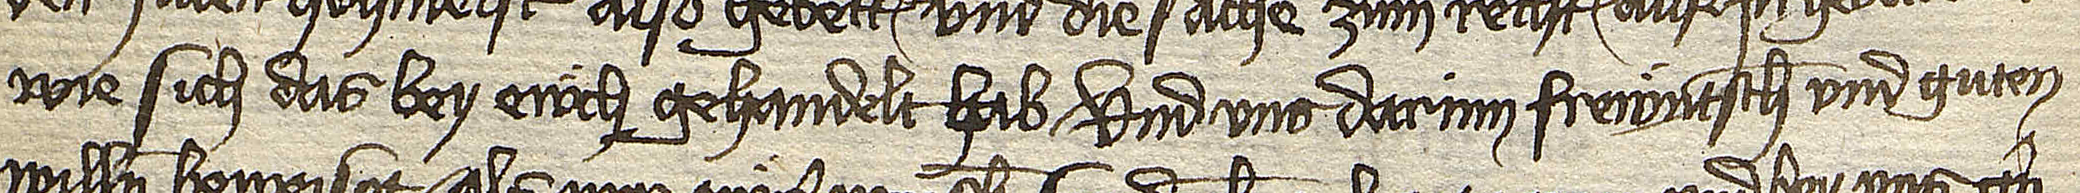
wie ſich das bey ewch gehandelt hab / Vnd vns darinn frewntſch* vnd guten
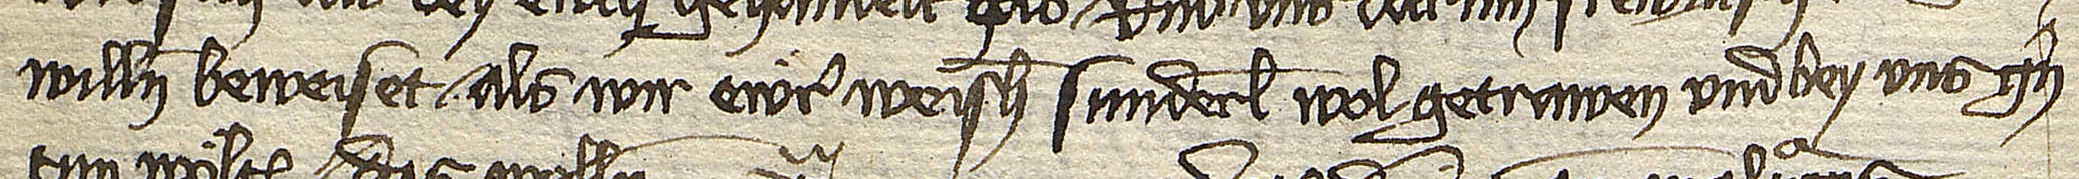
willn* beweiſet / als wir ewr* weiſh* ſunderl* wol getrawen vnd bey vns g*n
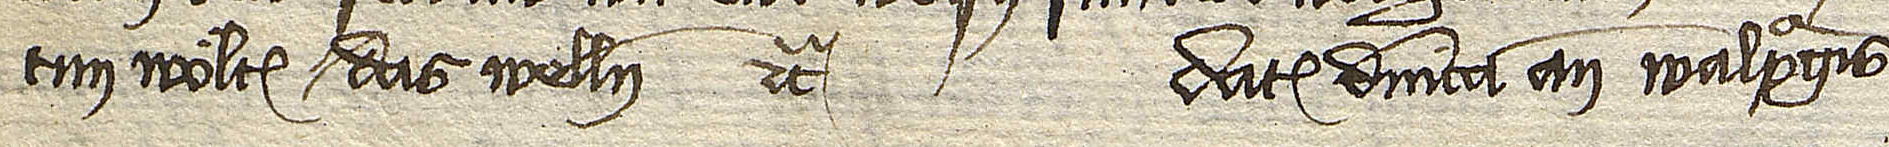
tun wölt* / das welln* ec* dat* dnica* an* walp*gis
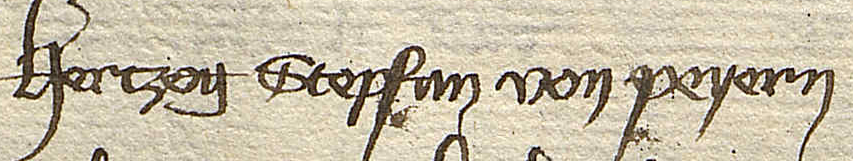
Hercʒog Stepfan von Peyern
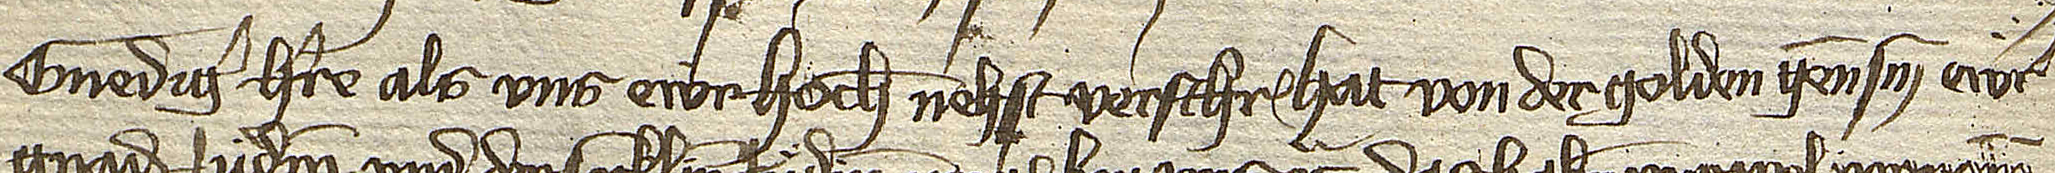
Gnedig* h*re als vns ewr Hoch* nehſt verſchr* hat von der golden genſin ewr*
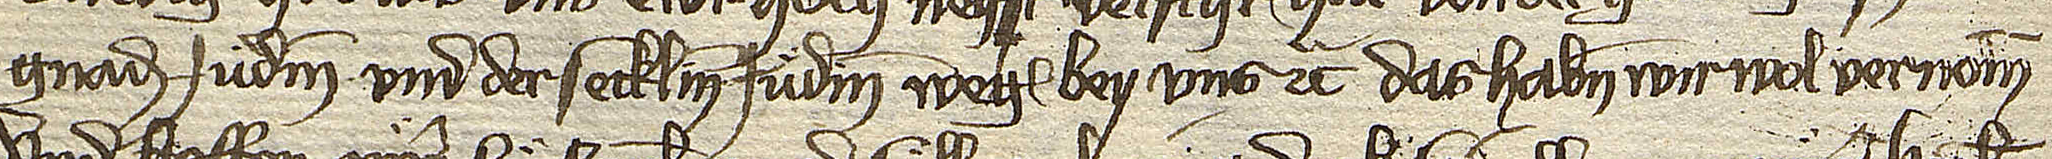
gnad* Iüdin* vnd der ſecklin* Iüdin* weg* bey vns ec* das habn* wir wol vernom*
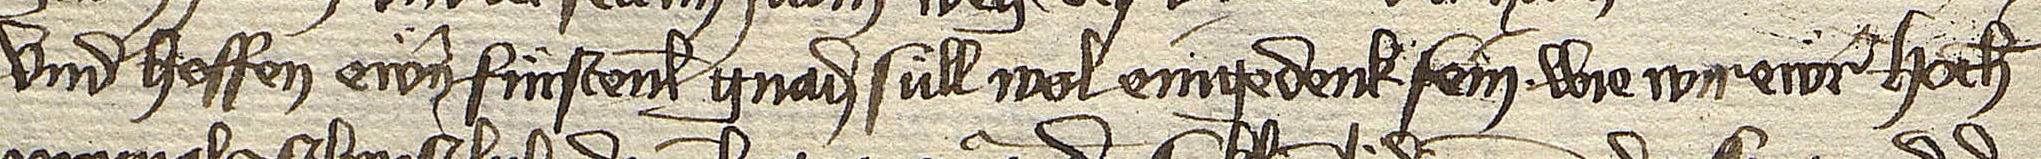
vnd hoffen ew*n fürſtenl* gnad* ſüll wol eingedenk ſein . wie wir ewr* Hoch*
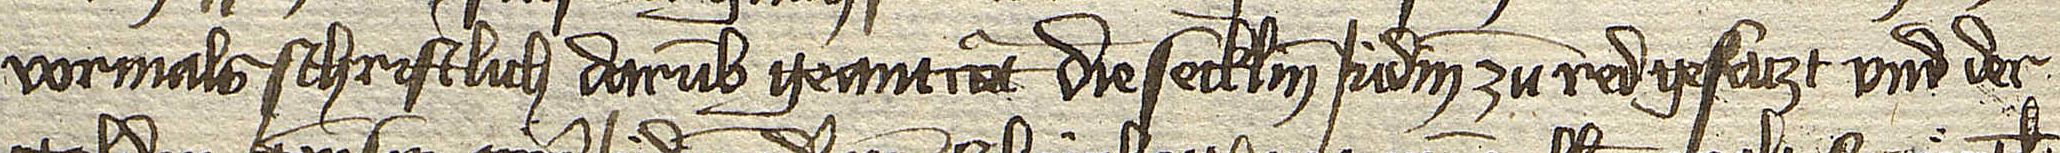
vormals ſchriftlich darub* geantw*t Die ſecklin* Iüdin* ʒu red geſacʒt vnd der
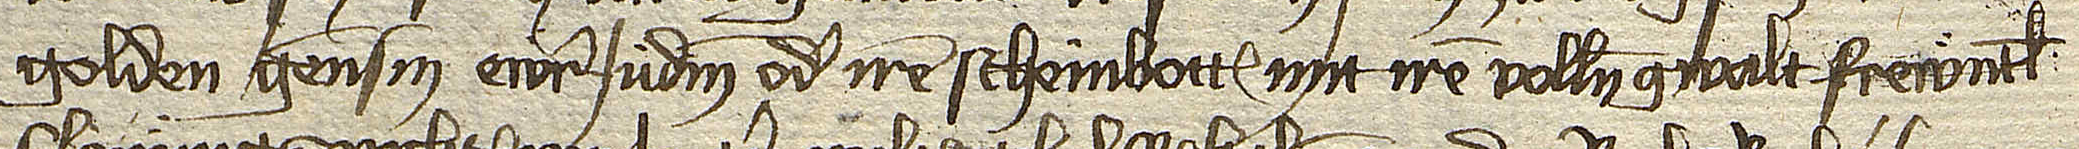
golden gen*ſin ewr* Iüdin* od* ire* ſcheinbott* mit ire* volln* gwalt frewntl*
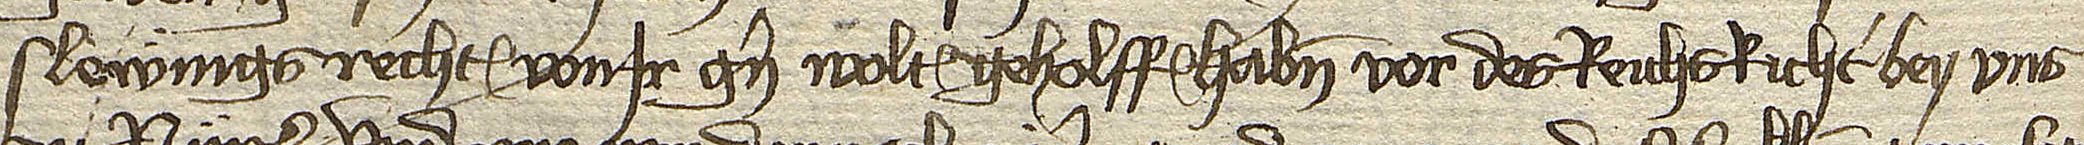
ſlewnigs recht* von Ir g*n wolt* geholff* habn* vor des Reichs Richt* bey vns
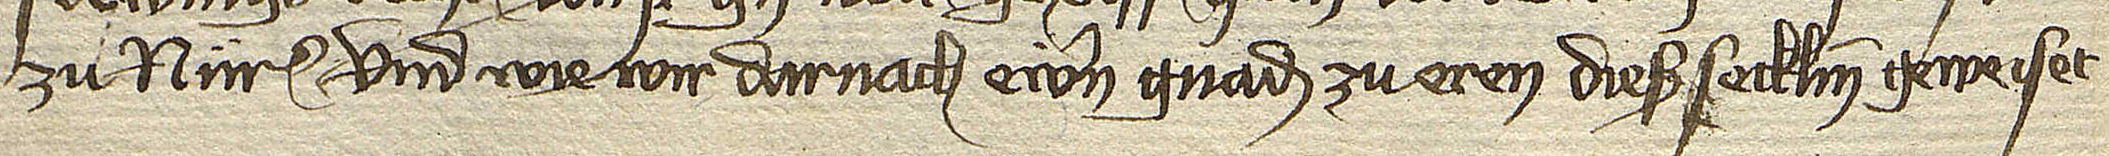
ʒu Nür* / Vnd wie wir darnach ew*n gnad* ʒu eren dieſ* ſecklin* geweiſet
